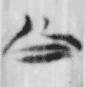公
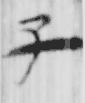子
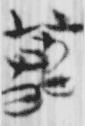○（春）
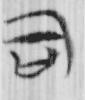司
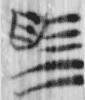馬
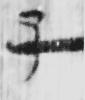子
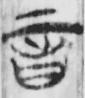音
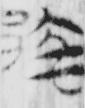○（蔡）
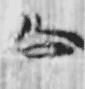公
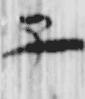子
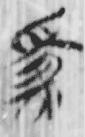○（家）
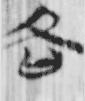各
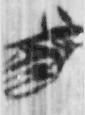戠
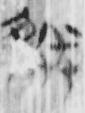豢
